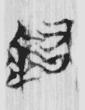{手厷}
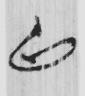㠯（以）
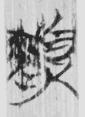{犬肉頁}
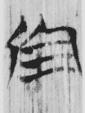於
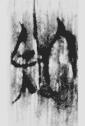{允夂}
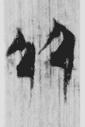{瓜瓜}
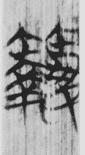{竹執}
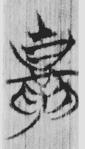{由革}
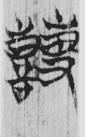{喜專}
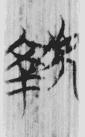{幸虎}
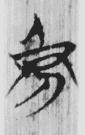{𠂊？儿}（穫）
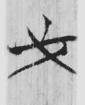戈
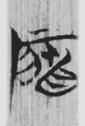盾
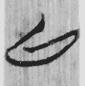㠯（以）
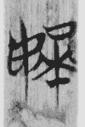{女日朿}
